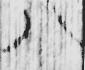八
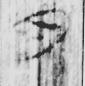月
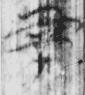辛
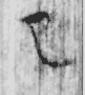巳
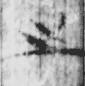之
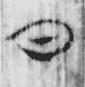日
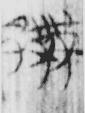○（許）
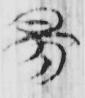昜
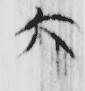大
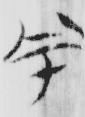冢
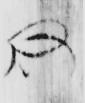尹
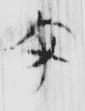宋
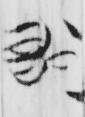訟
